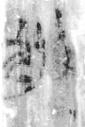歲（歲）
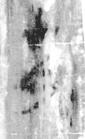十月
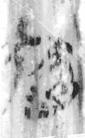○（屈）
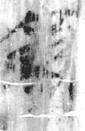月亯
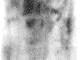才（在）
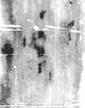西
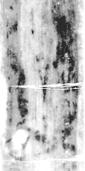○（爨）
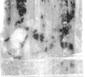月
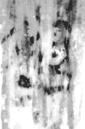遠
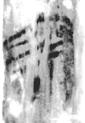○（夕）
